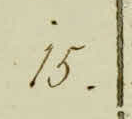15.
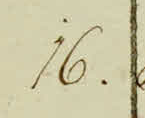16.
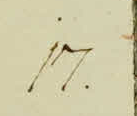17.
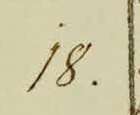18.
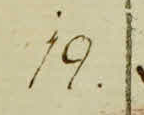19.
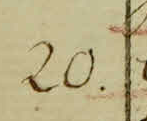20.
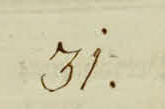31.
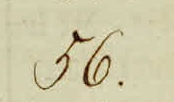56.
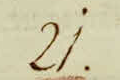21.
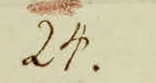24.
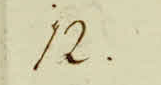12.
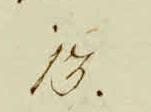13.
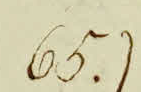65.
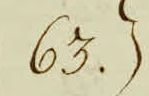63.
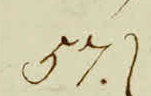57.
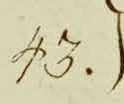43.
